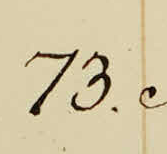73.
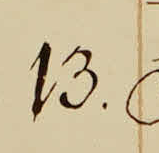13.
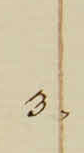3
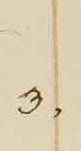3
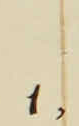1
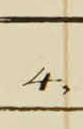4
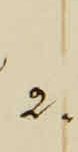2
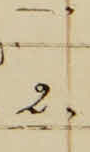2
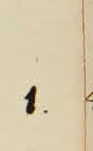1.
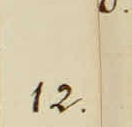12.
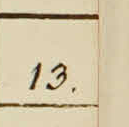13.
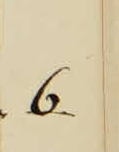6
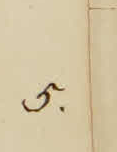5.
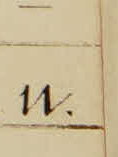11.
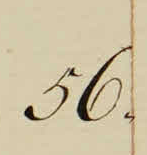56
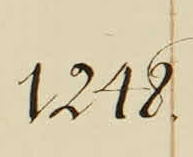1248
